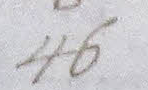46
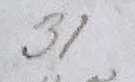31
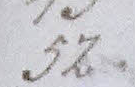52
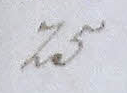25
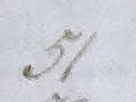51
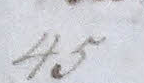45
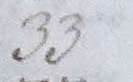33
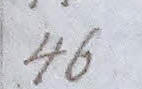46
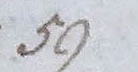59
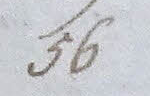56
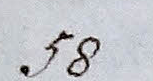58
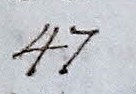47
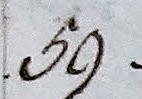59
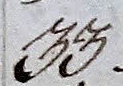33
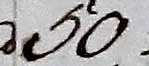50
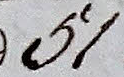51
